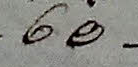60
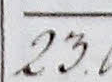23
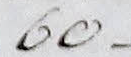60
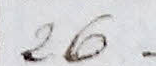26
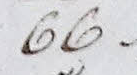66
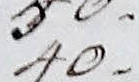40
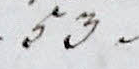53
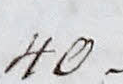40
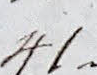41
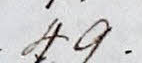49
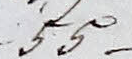55
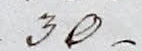30
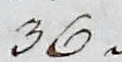36
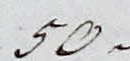50
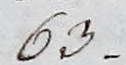63
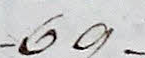69
